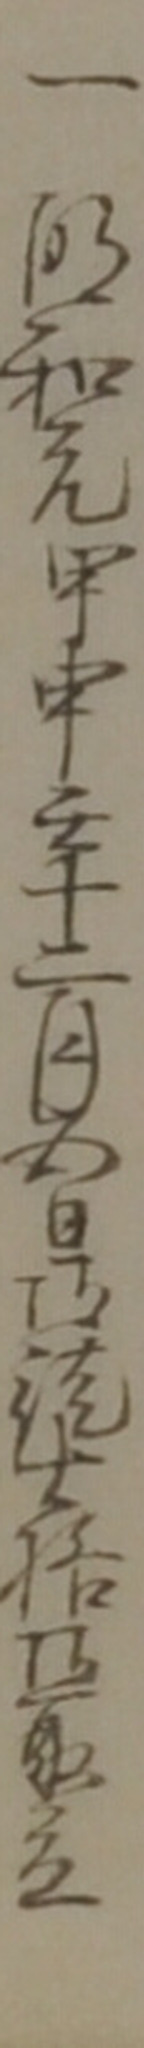一明和元甲申閏十二月五日御徒士格御取立
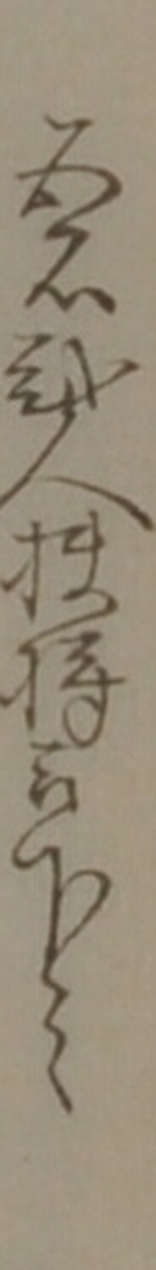五石弐人扶持被下之
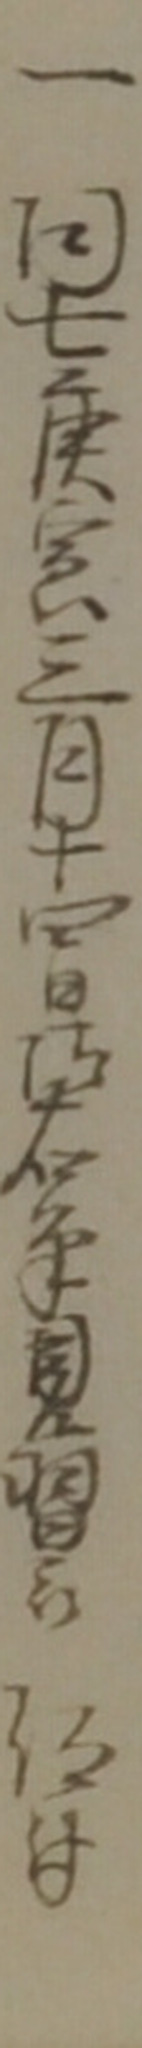一同七庚寅三月十四日御右筆見習被仰付
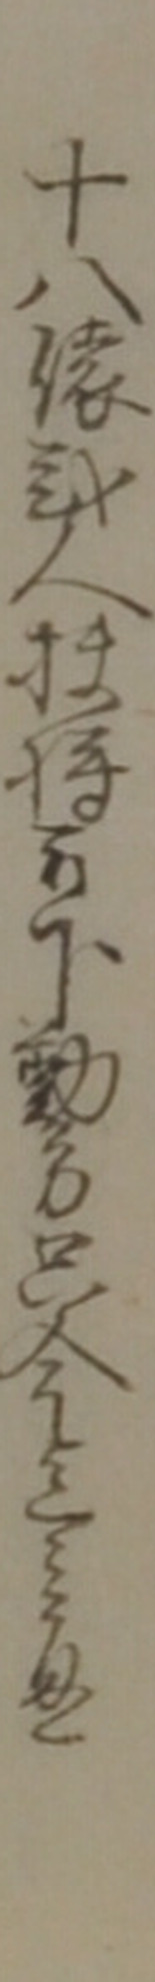十八俵弐人扶持被下勤方只今迄之通
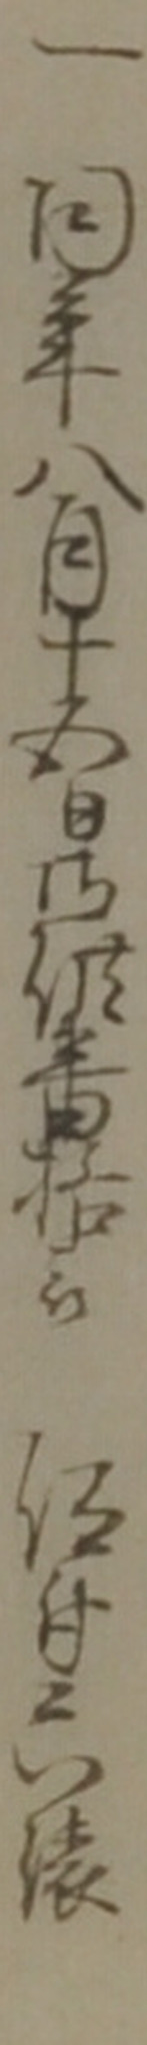一同年八月十五日御供番格被仰付六俵
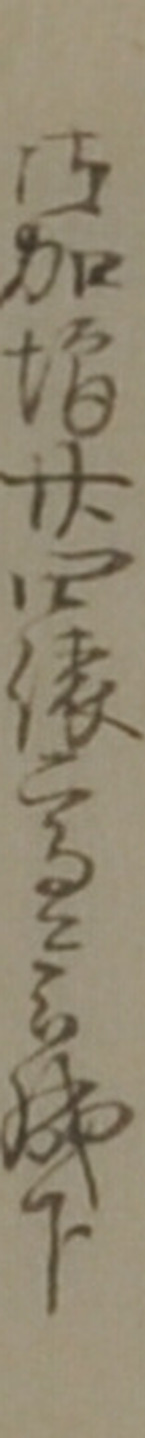御加増廿四俵高ニ被成下
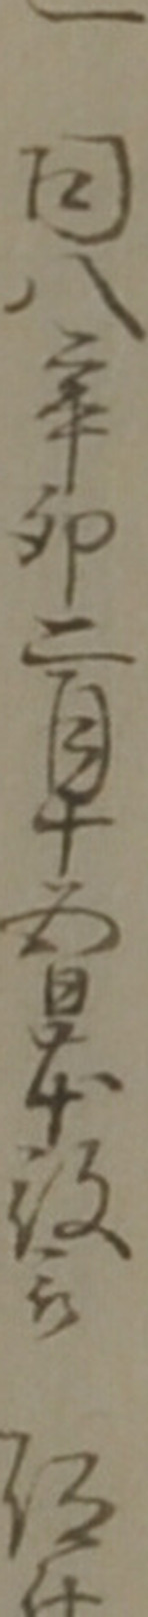一同八辛卯二月十五日本役被仰付

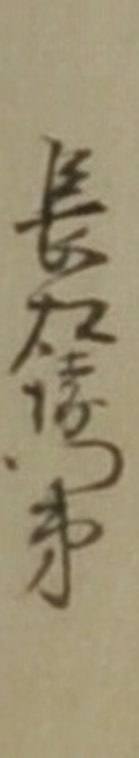長左衛門弟
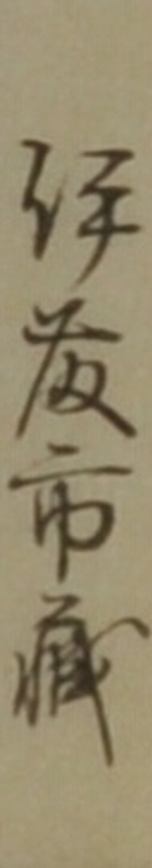伊藤市蔵
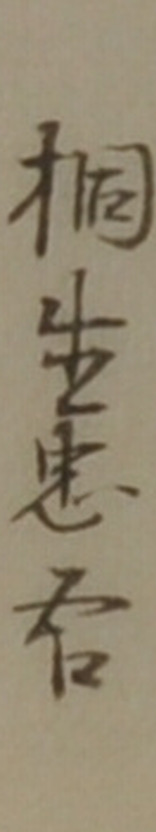桐生忠吾
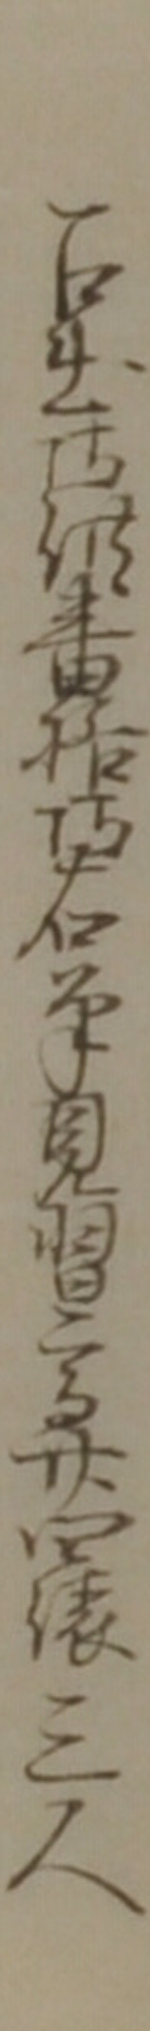召出御供番格御右筆見習高廿四俵三人
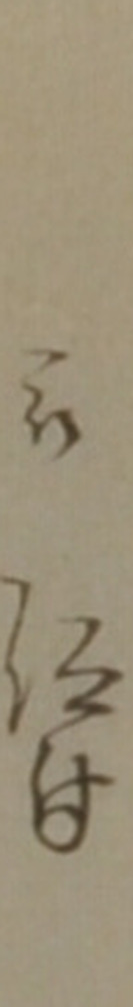被仰付
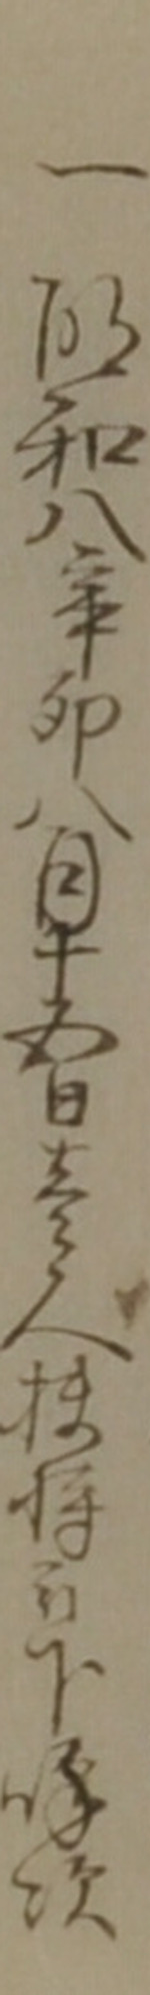一明和八辛卯八月十五日壱人扶持被下呼次
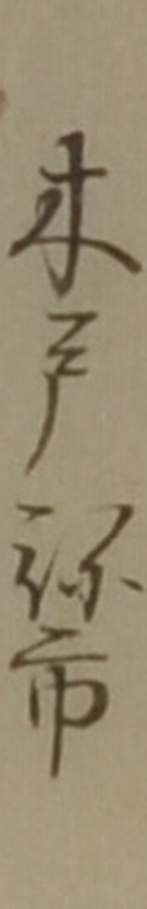木戸弥市
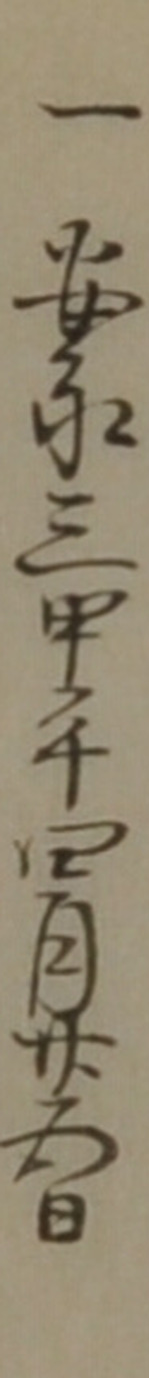一安永三甲午四月廿五日
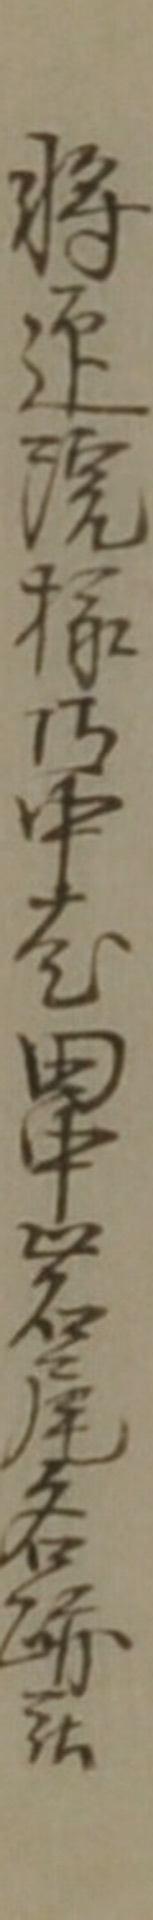将迎院様御中老田中岩尾名跡被
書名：無足廃家（壱）
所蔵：伊那市立高遠町図書館・合同会社AMANE
